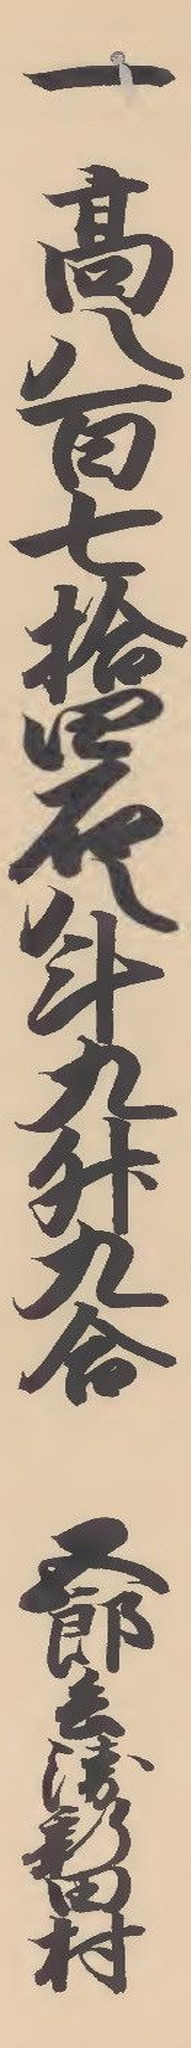一高八百七拾四石八斗九升九合五郎兵衛新田村
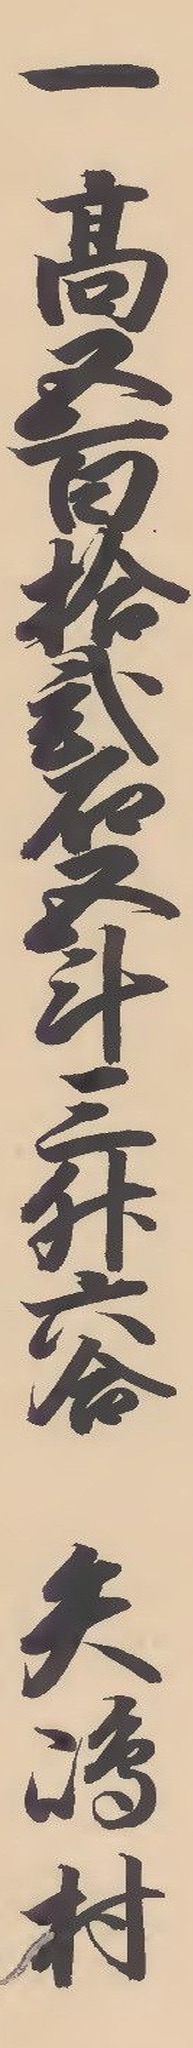一高五百拾弐石五斗三升六合矢島村

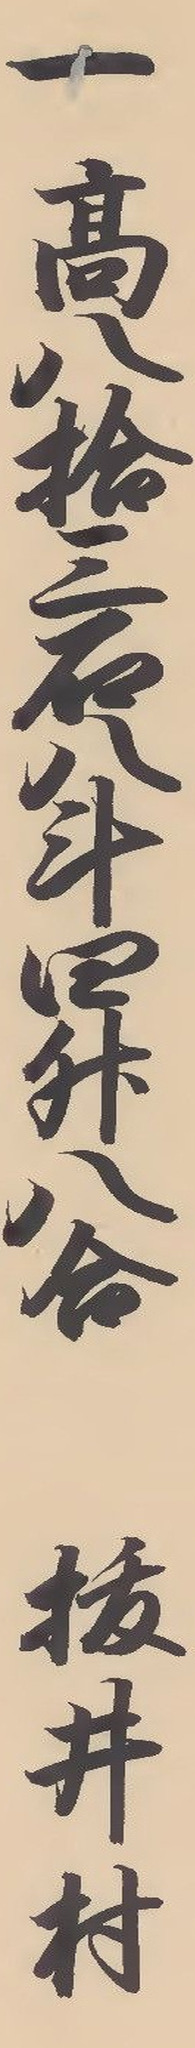一高八拾三石八斗四升八合抜井村
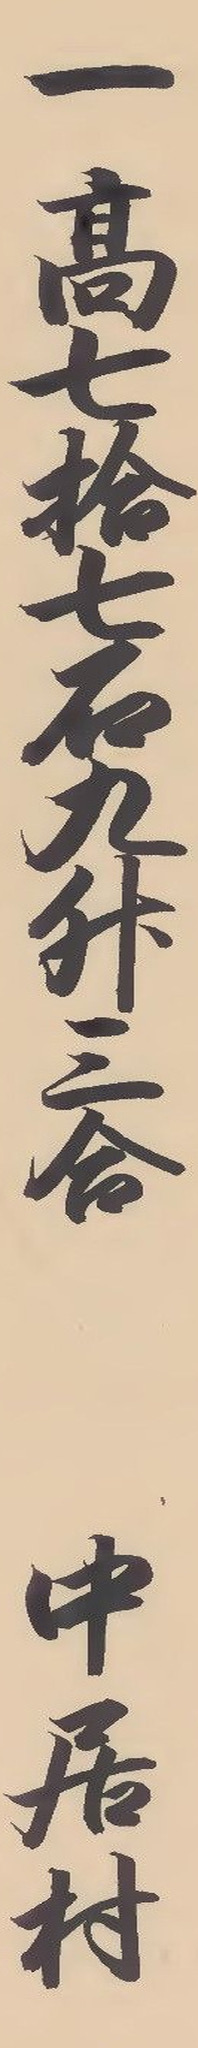一高七拾七石九升三合中居村
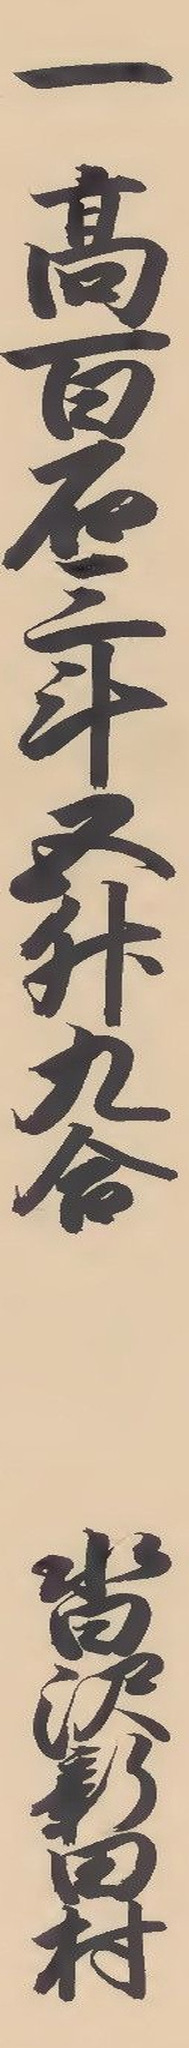一高百石三斗五升九合沓沢新田村
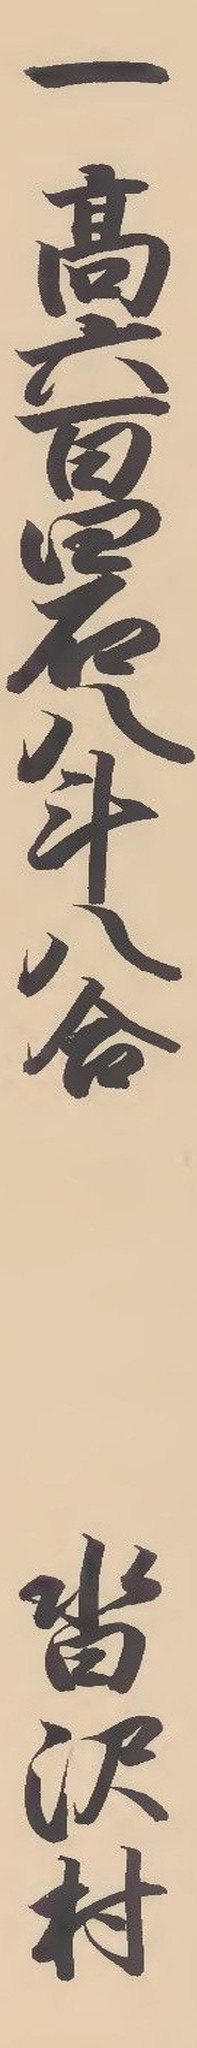一高六百四石八斗八合沓沢村
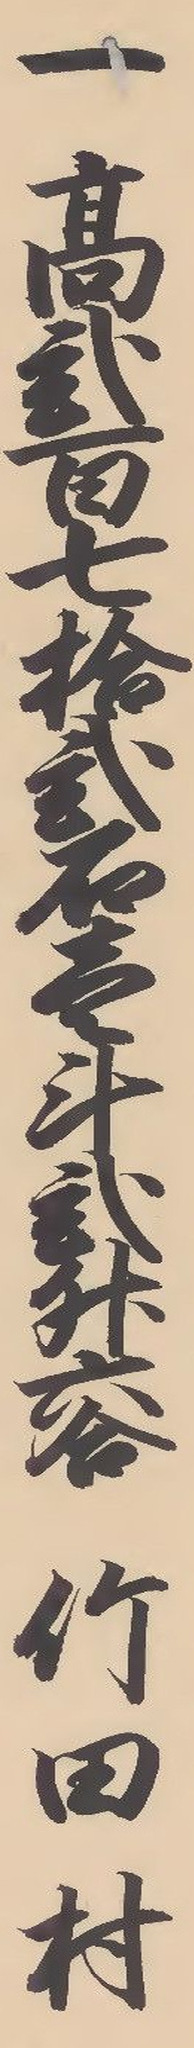一高弐百七拾弐石壱斗弐升六合竹田村
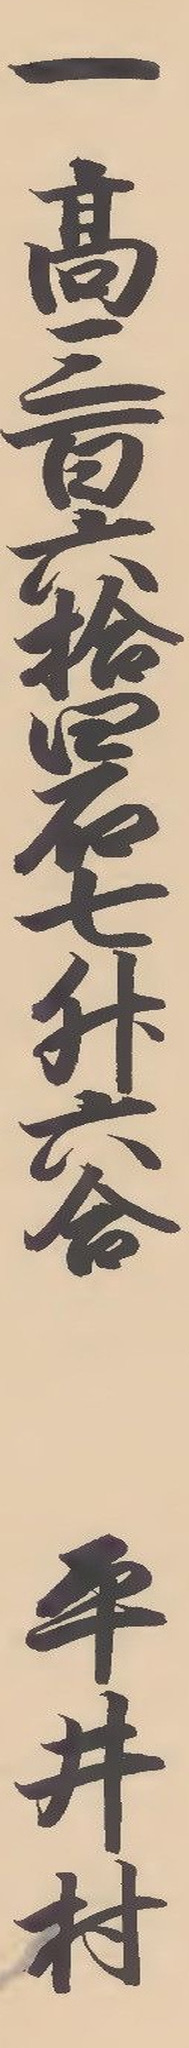一高三百六拾四石七升六合平井村

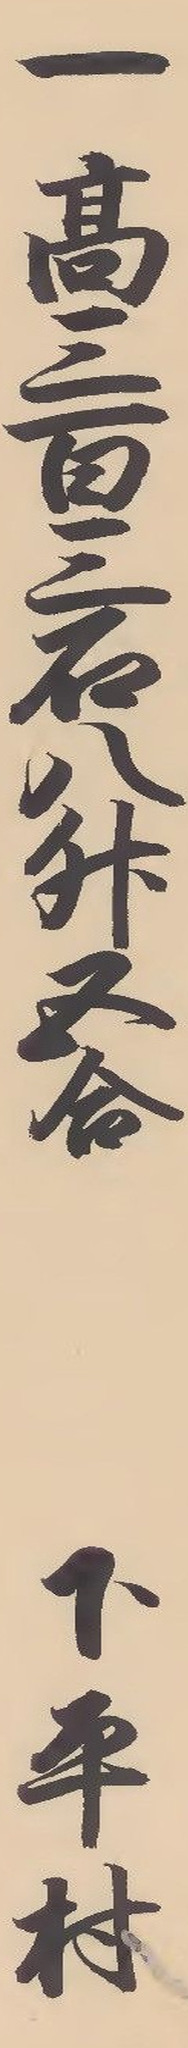一高三百三石八升五合下平村
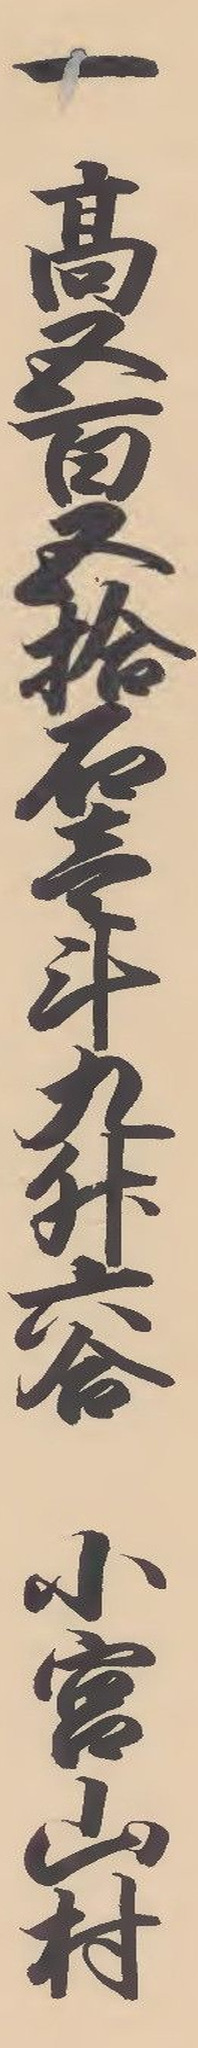一高五百五拾石壱斗九升六合小宮山村
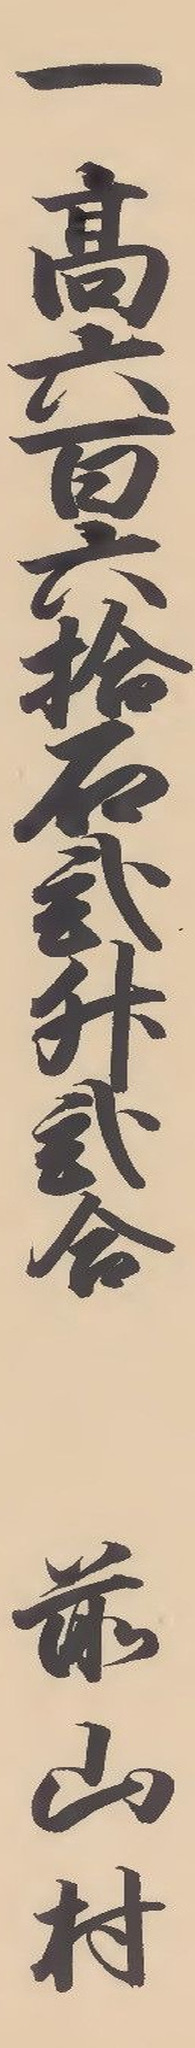一高六百六拾石弐升弐合前山村
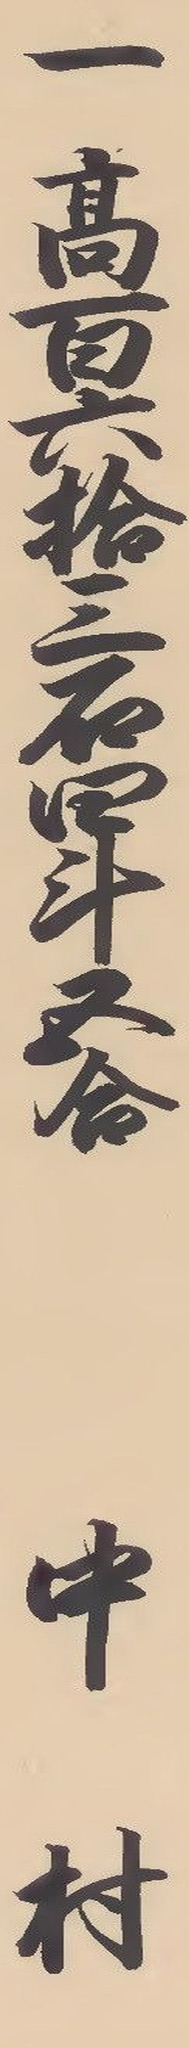一高百六拾三石四斗五合中村
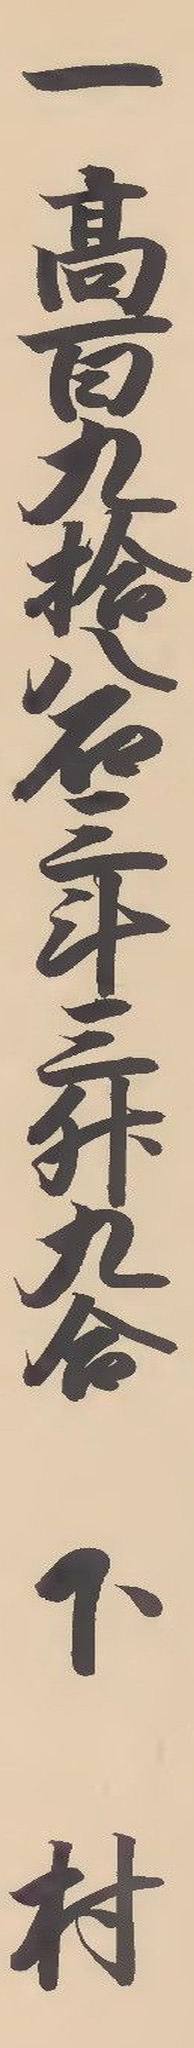一高百九拾八石三斗三升九合下村
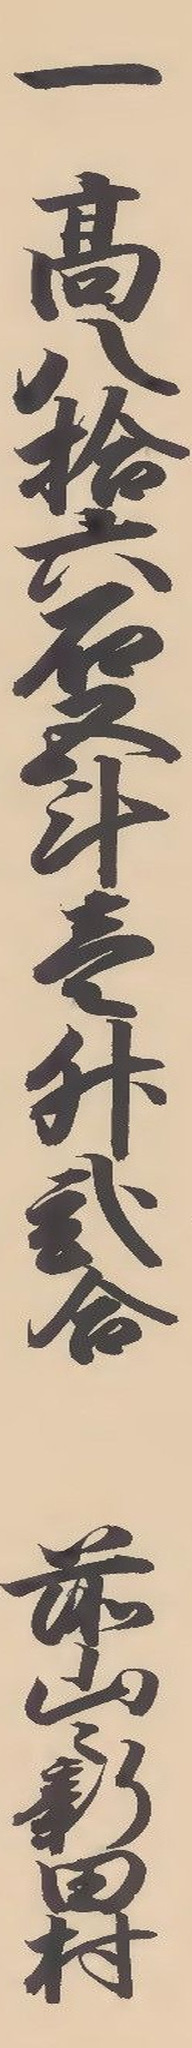一高八拾六石五斗壱升弐合前山新田村
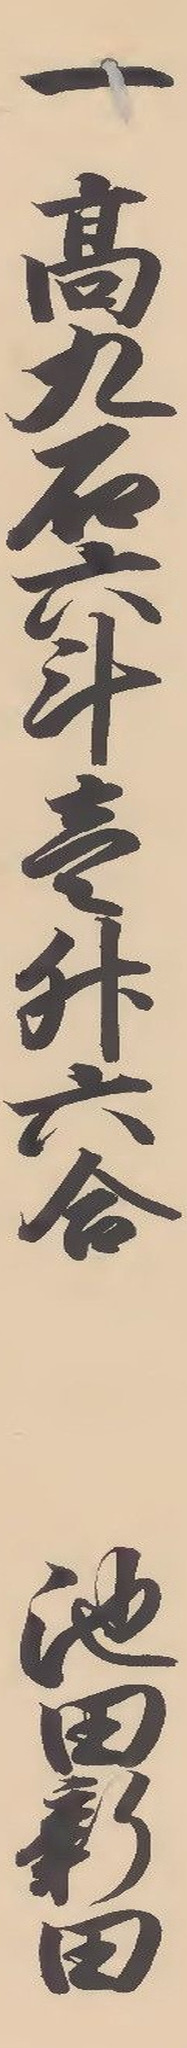一高九石六斗壱升六合池田新田
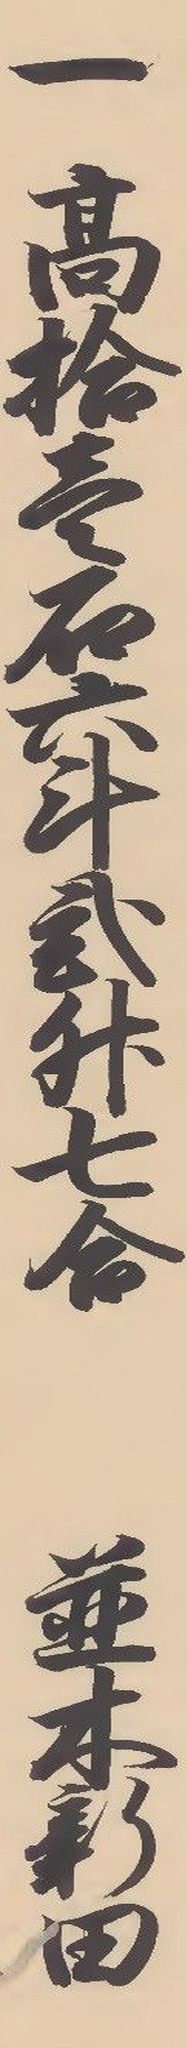一高拾壱石六斗弐升七合並木新田
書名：信濃国郷帳
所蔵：国立公文書館 National Archives of Japan
